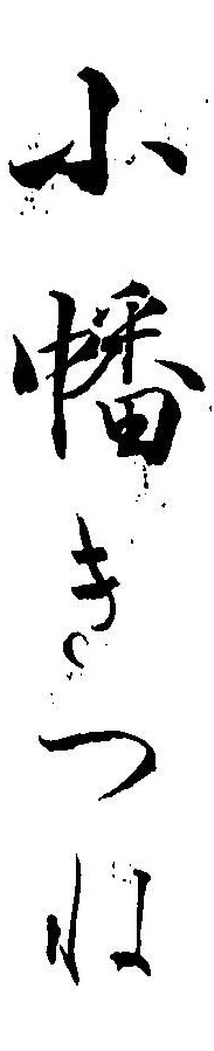木幡きつね

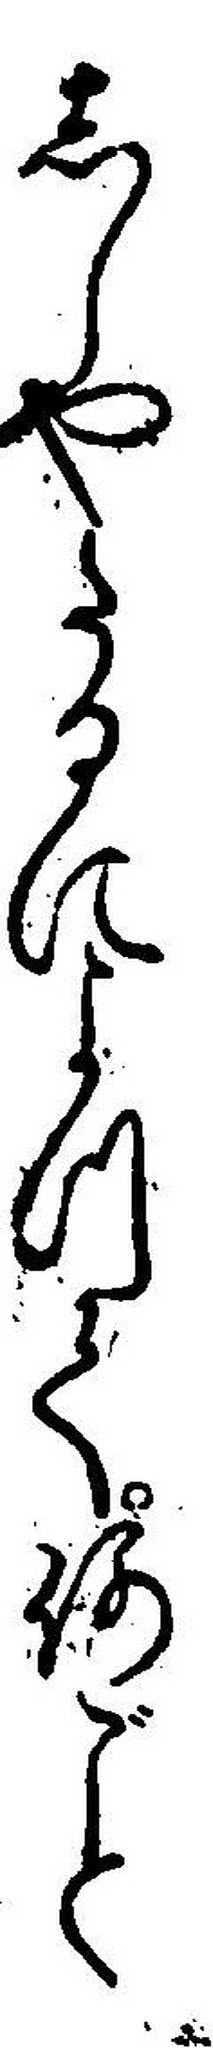ししやたるによつて。何ごと
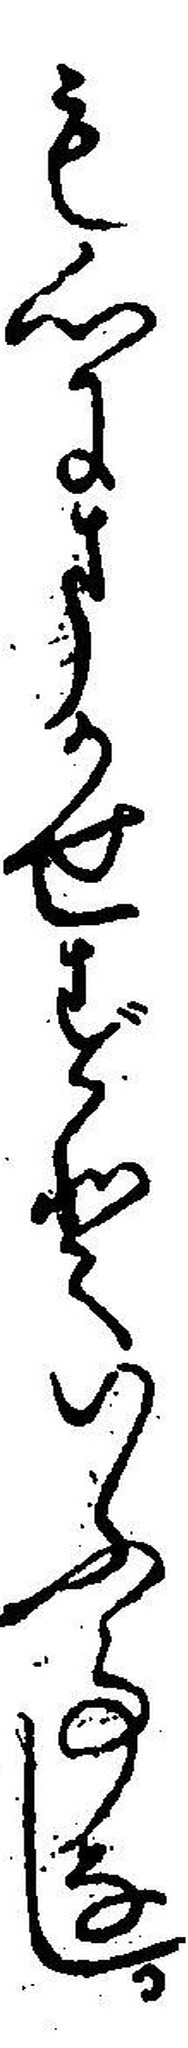も心にまかせずといふ事なし。
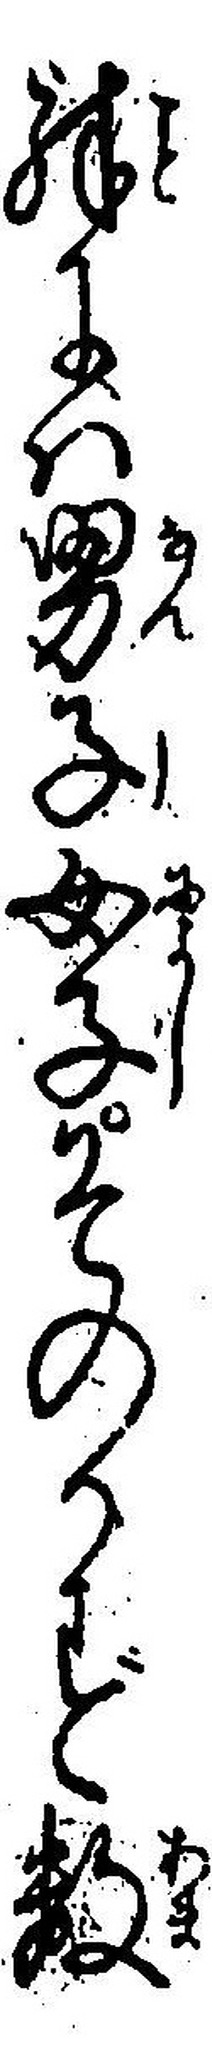殊には男子女子。そのかず数
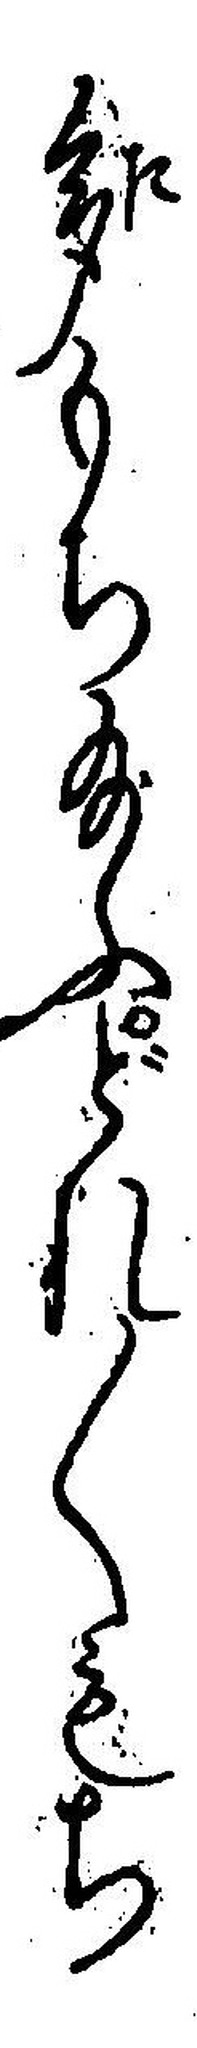多もち給ふ。どれ〳〵もち
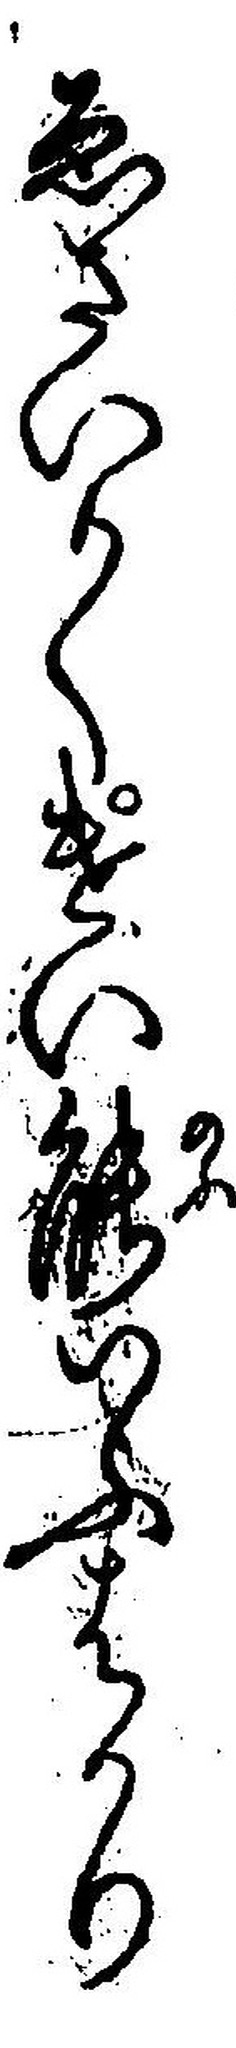ゑさいかく。けい能いふはかり
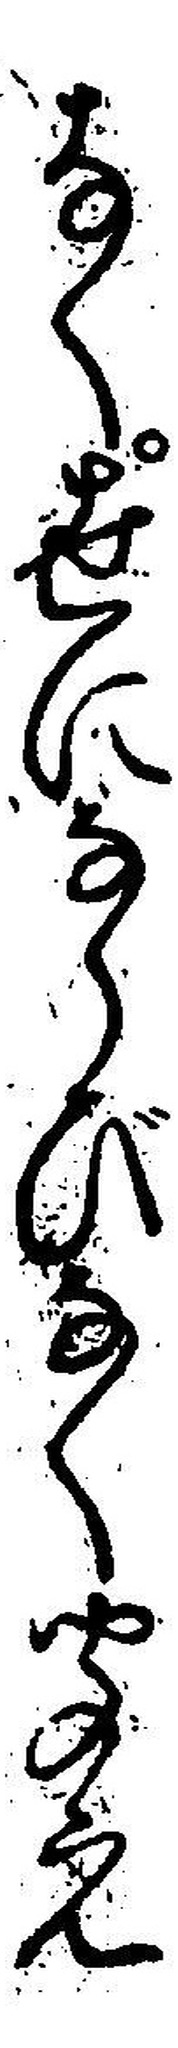なく。世にならびなく聞え
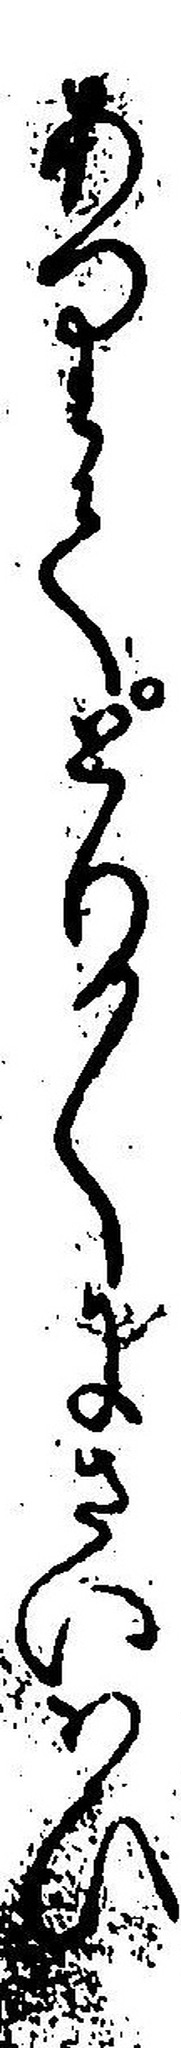ありて。とり〳〵にさいはひ
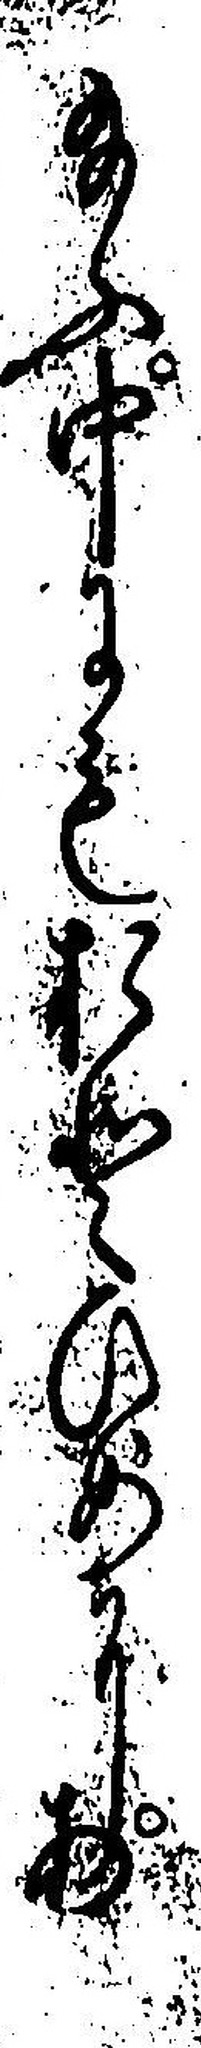給ふ。中にもおとひめに。あ
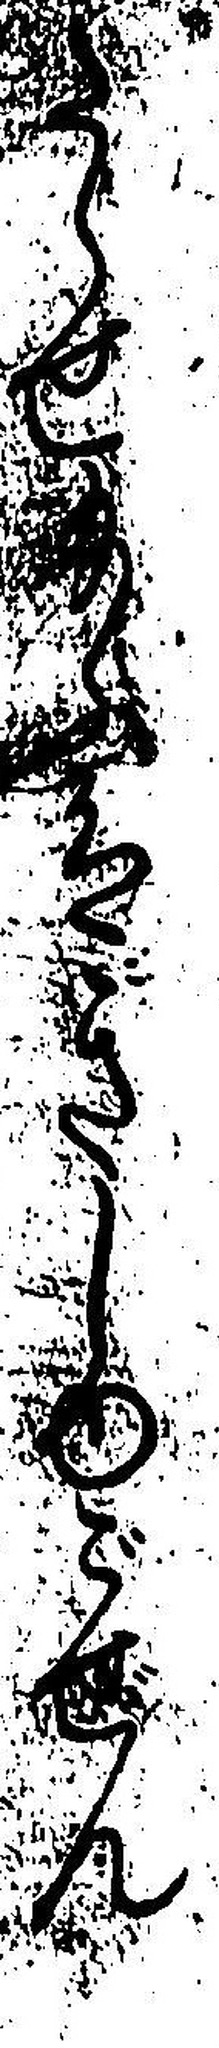たらせ給ふはきしゆごぜん

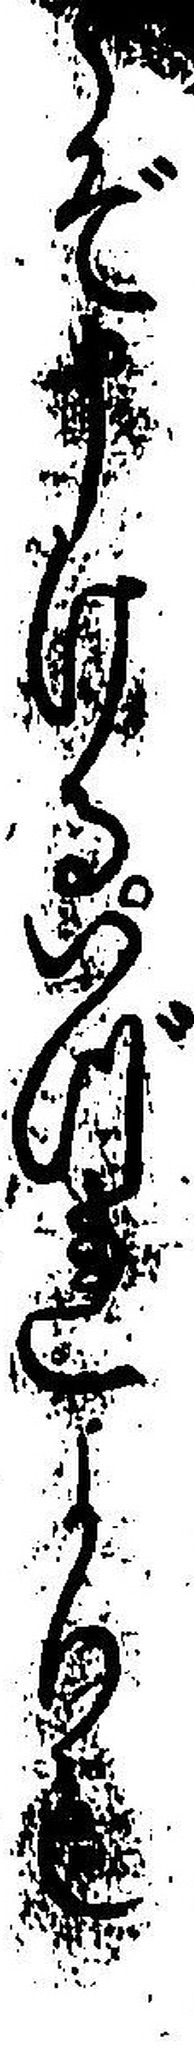とぞ申ける。いづれよりも
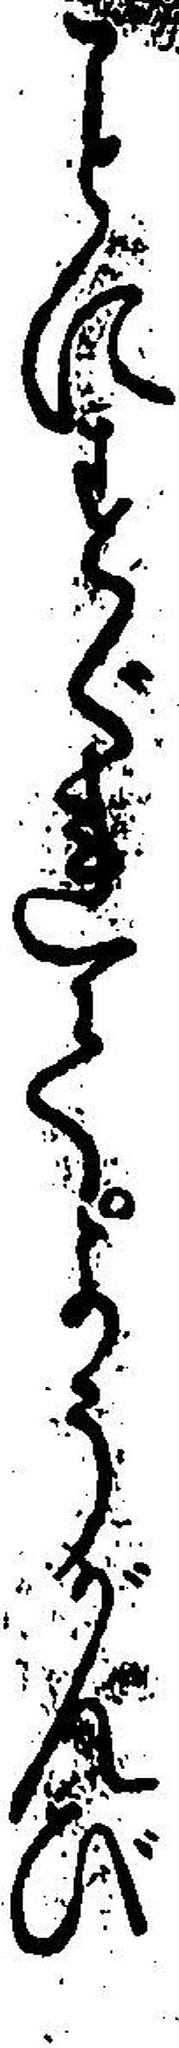ことにすぐれて。ようがんび
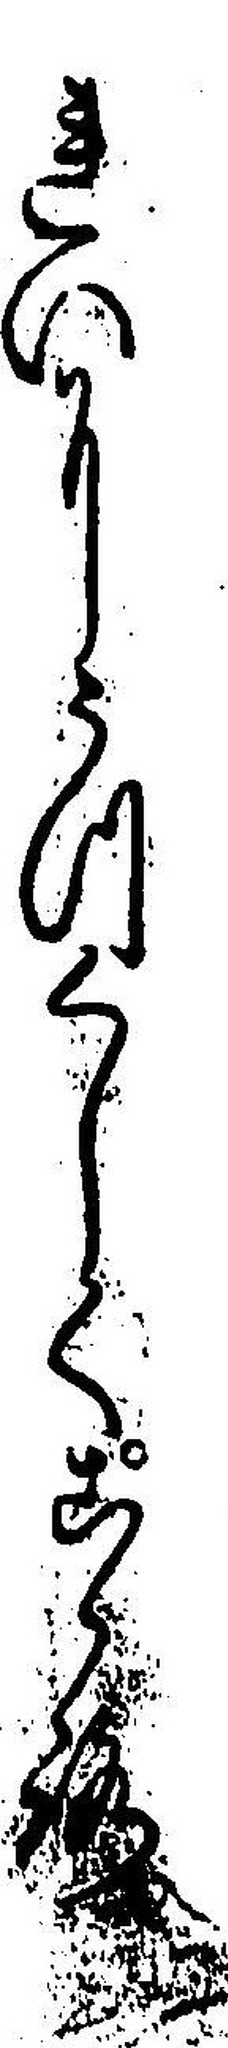れいにうつくしく。こゝろ
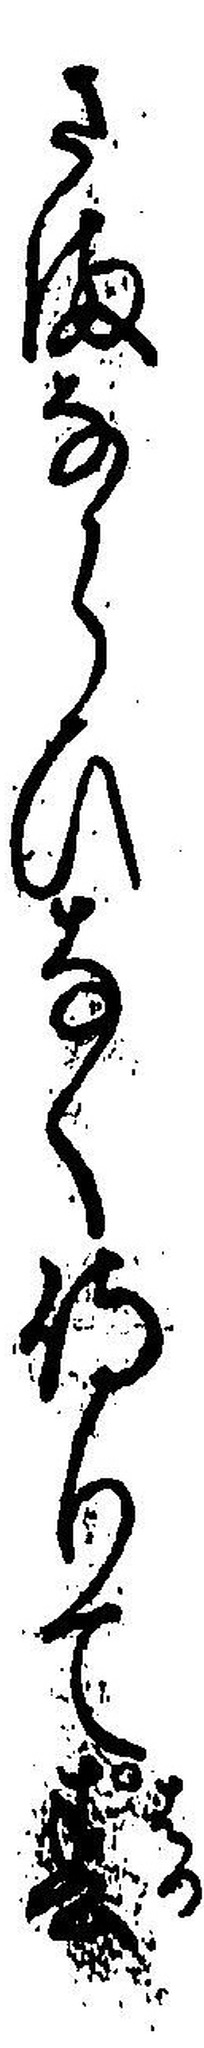さまならひなく侍りて。春
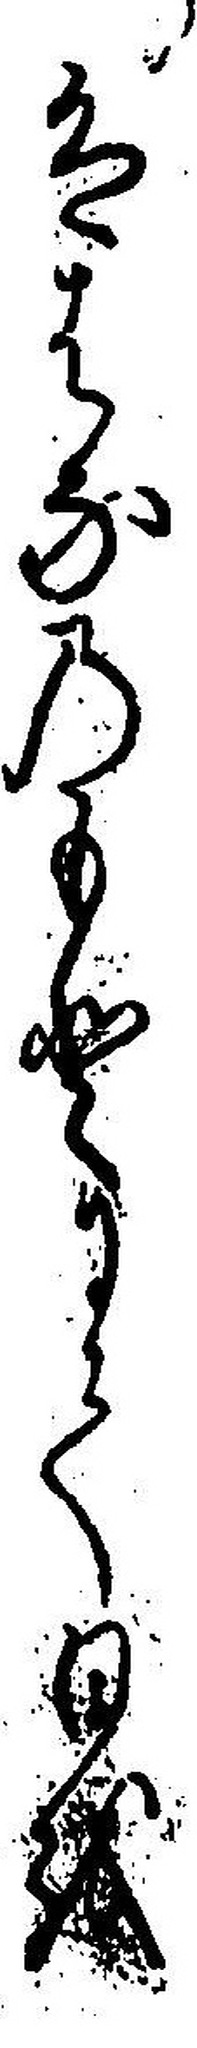ははなのもとにて日を
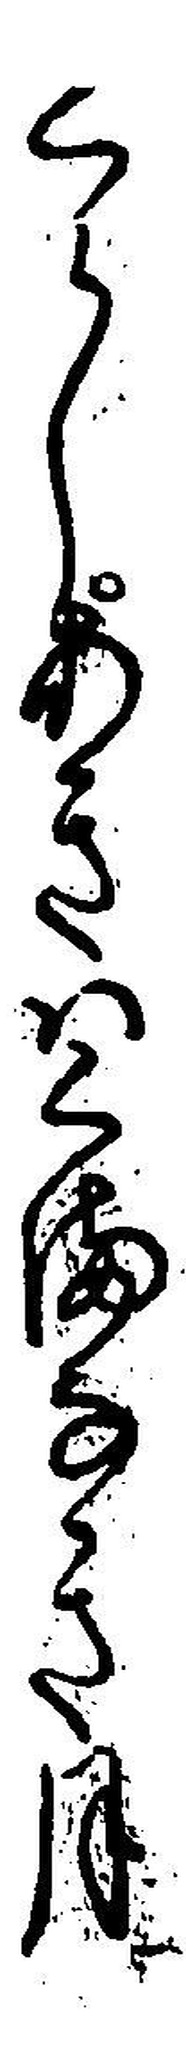くらし。あきはくまなき月
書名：木幡きつね
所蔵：東京大学総合図書館 General Library in the University of Tokyo, JAPAN
